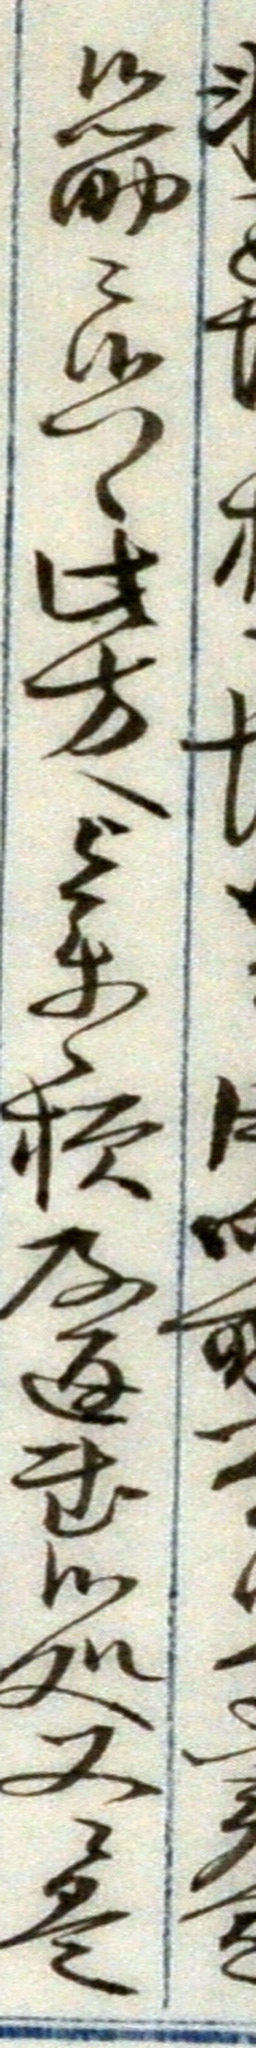候筋ニ候ハヽ此方へ被参候様及返書候処又々是
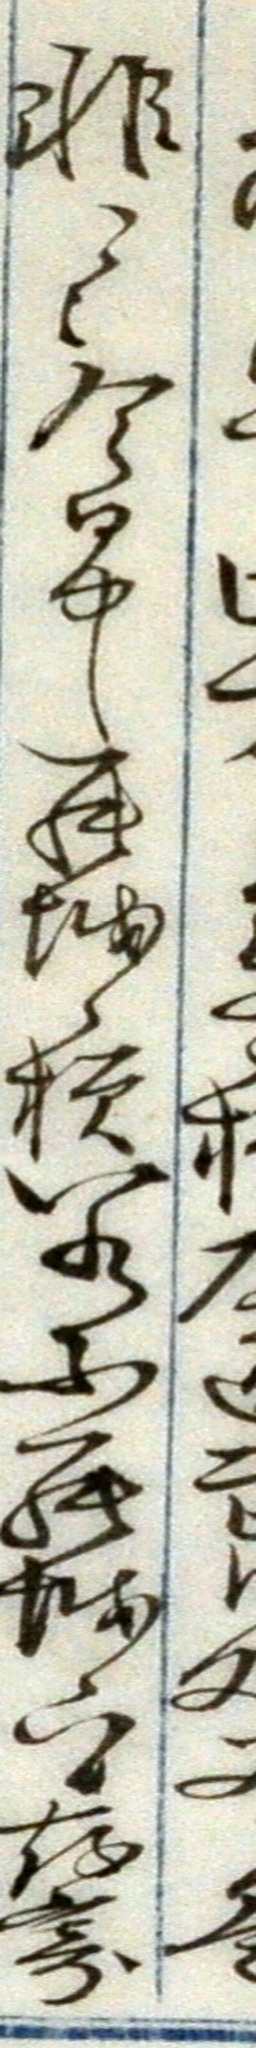非ニも今日中罷越候様若不罷越候ハヽ存寄
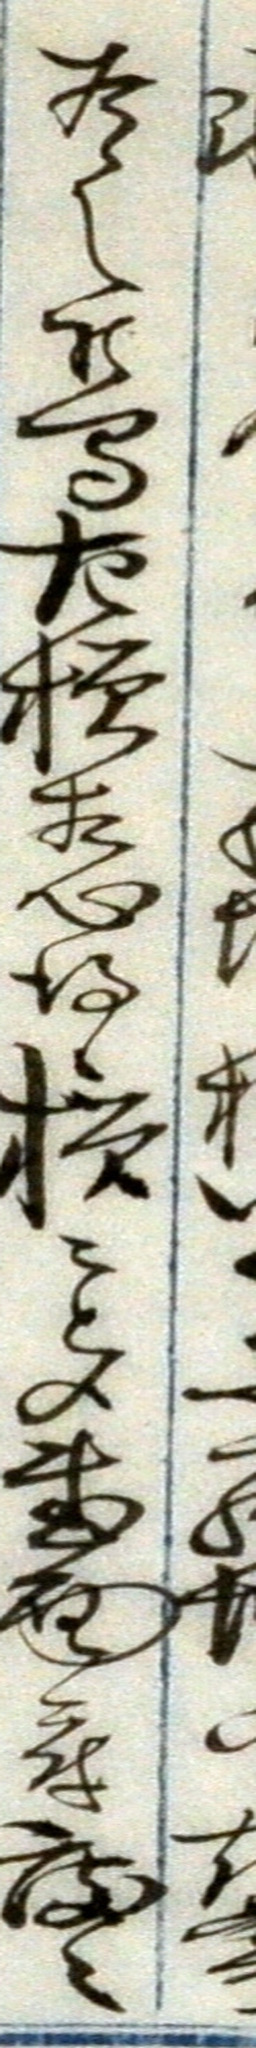有之候間左様相心得候様ニとの書面ニ付度々
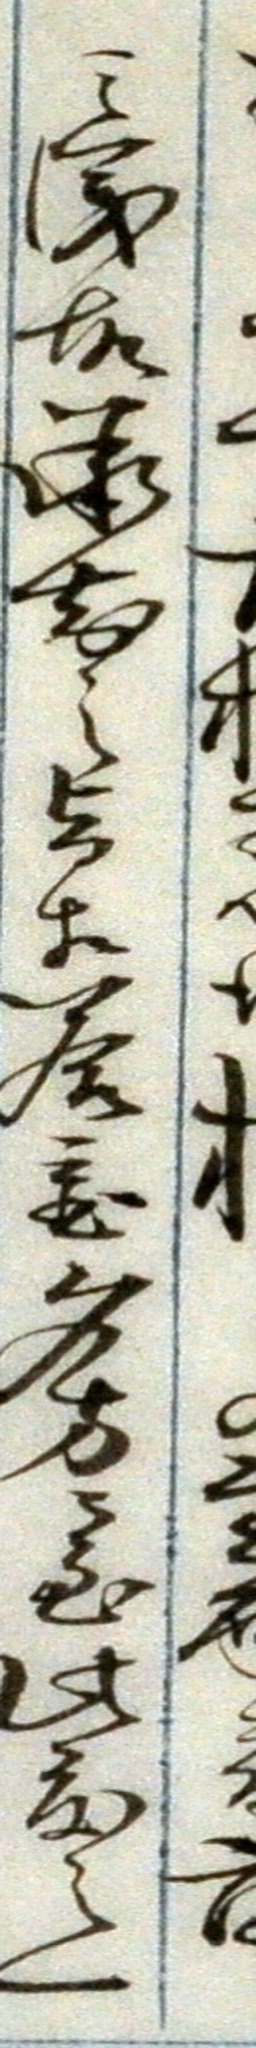之儀故承知之旨相答置夕方ニ至此度之一
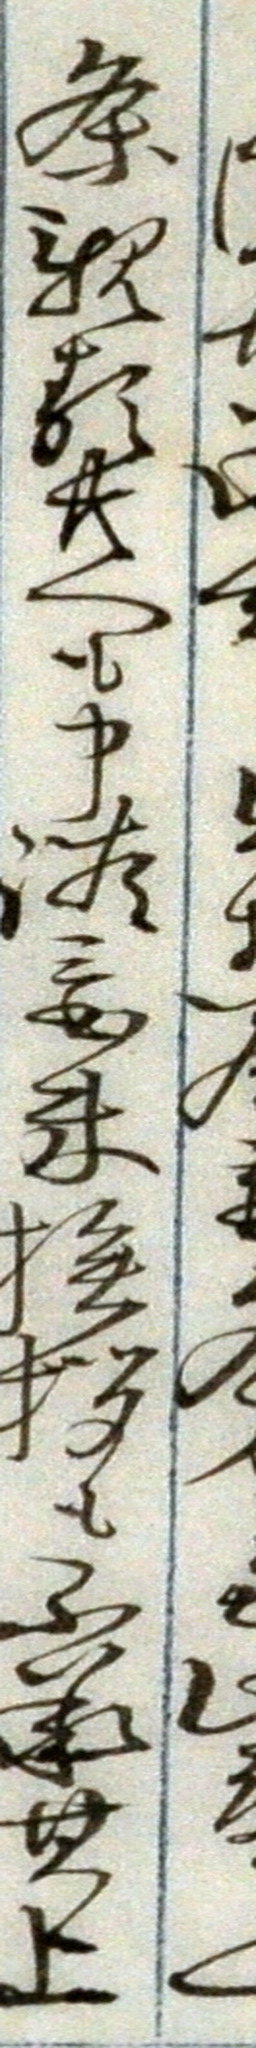条親類共へも申談置未挨拶も不承其上
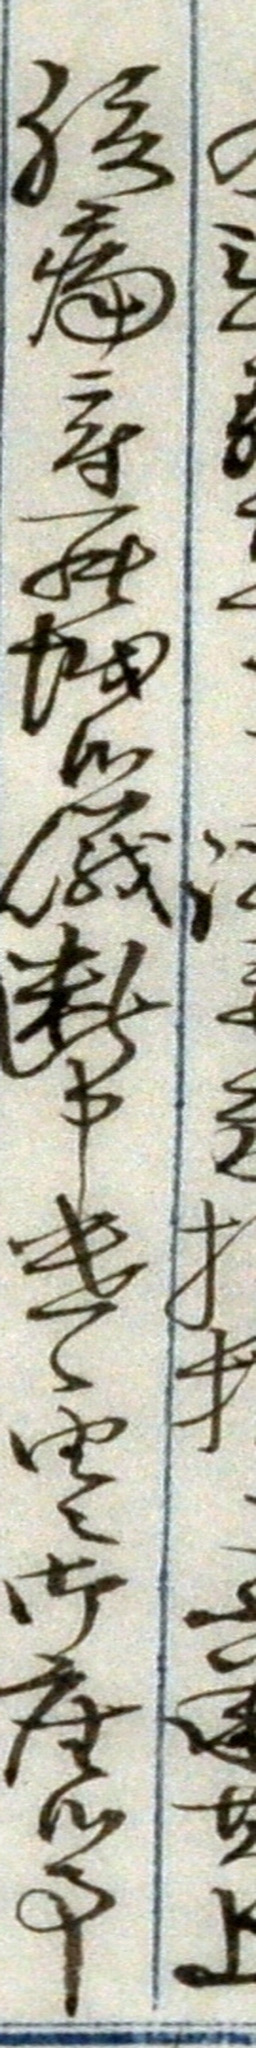腹痛ニ付罷越候儀断申遣候由ニ御座候事
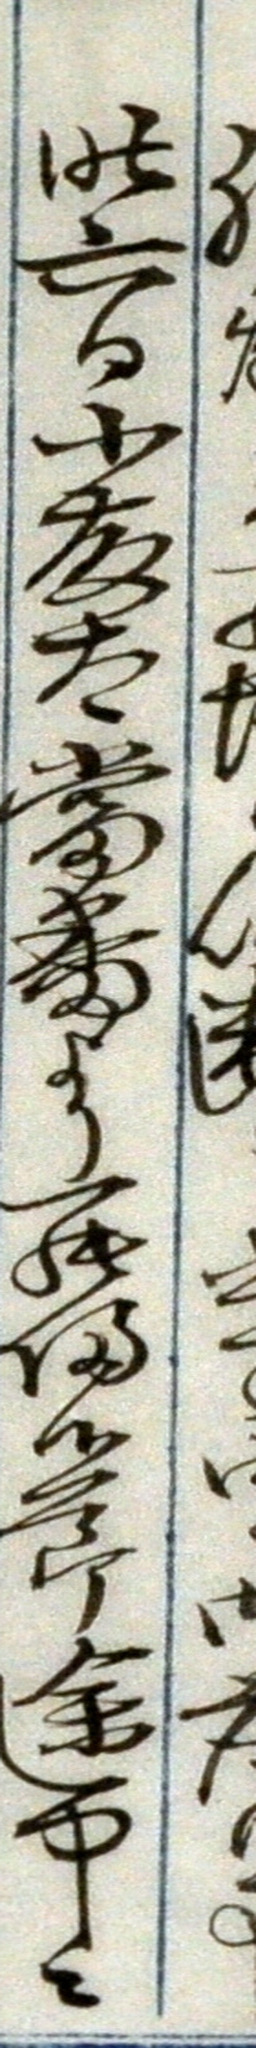一昨六日小藤太當番より罷帰候節途中ニ
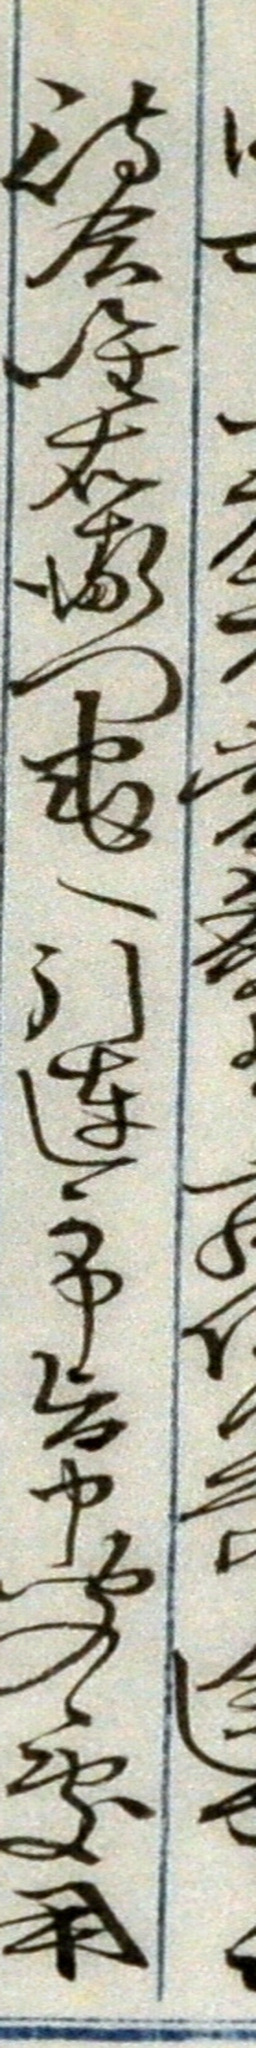待合唯右衛門宅へ引連可申旨申聞候處用
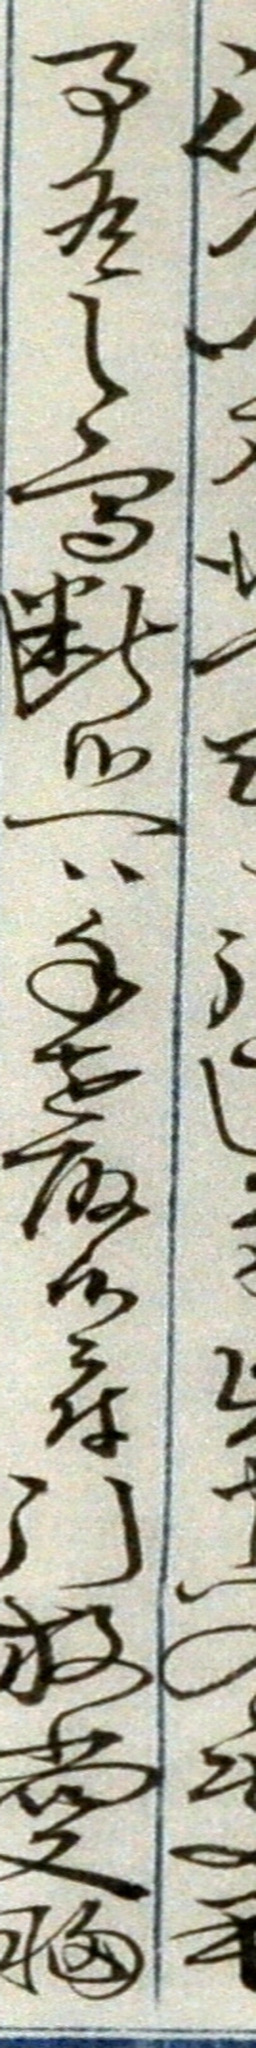事有之候間断候へハ手を取候ニ付引放尚又胸
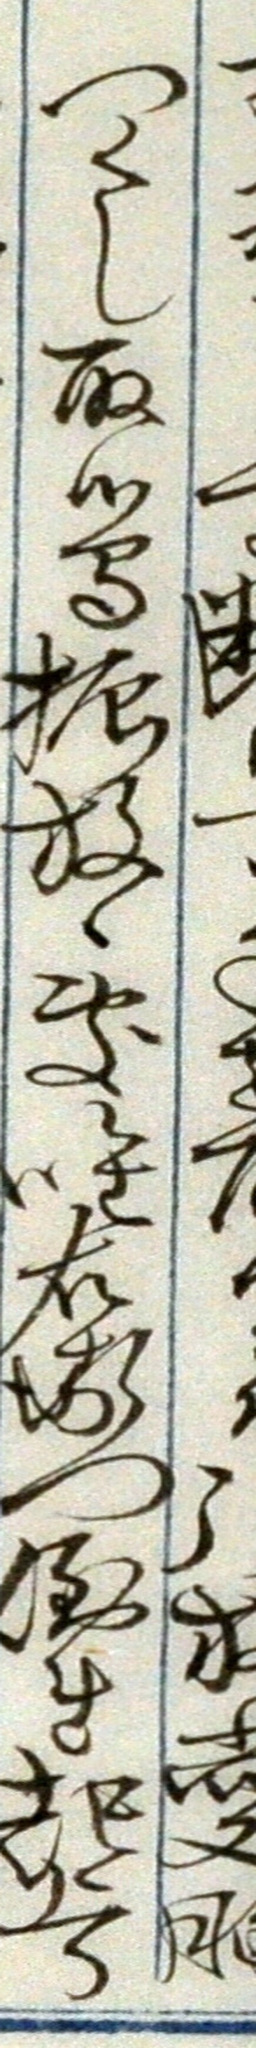つくし取候間振放候處唯右衛門倒れ起上り
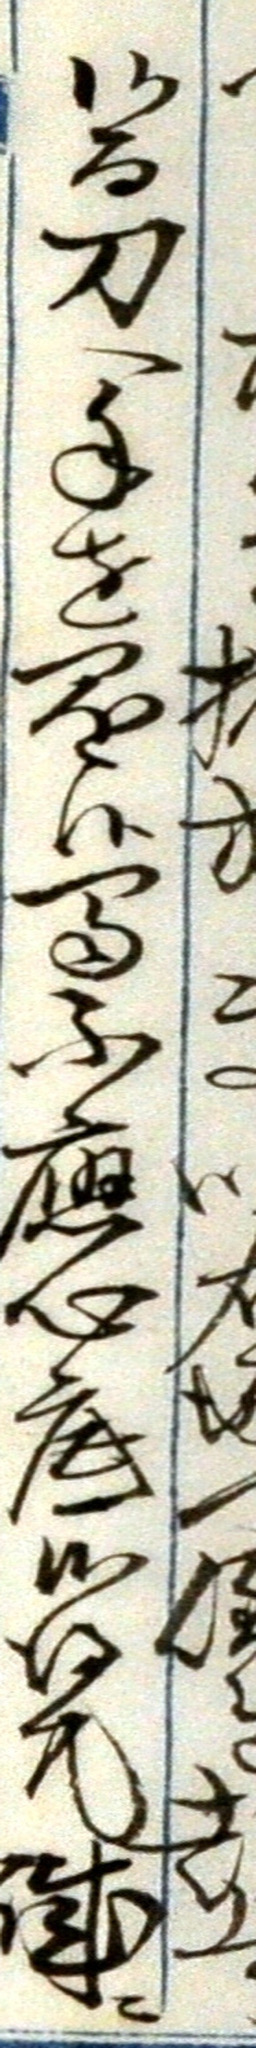候而刀へ手を懸候間不応心底候得共誠ニ

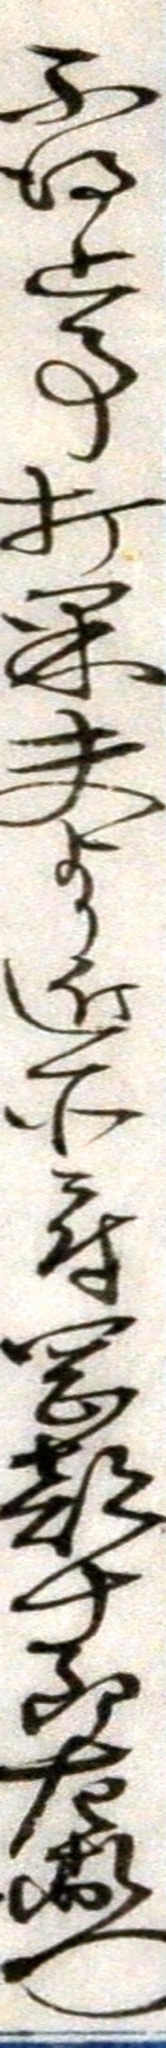不得止事打果夫より近所ニ付岡部十郎左衛門
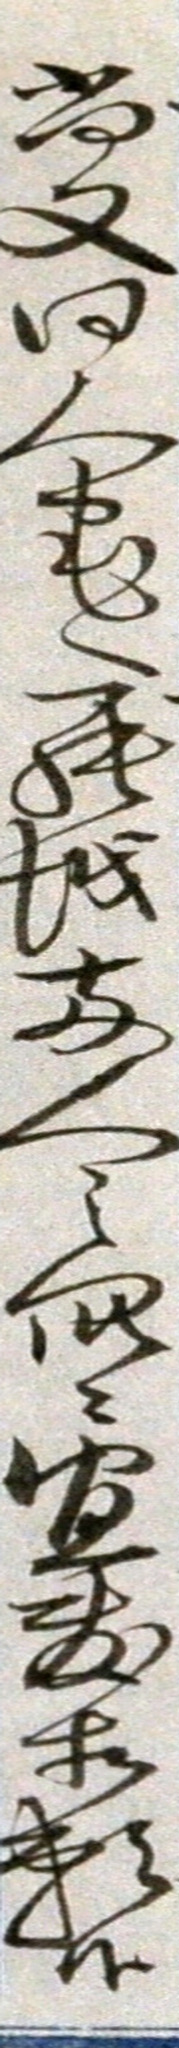尚又同人宅へ罷越両人之衆ニ宜敷相頼候
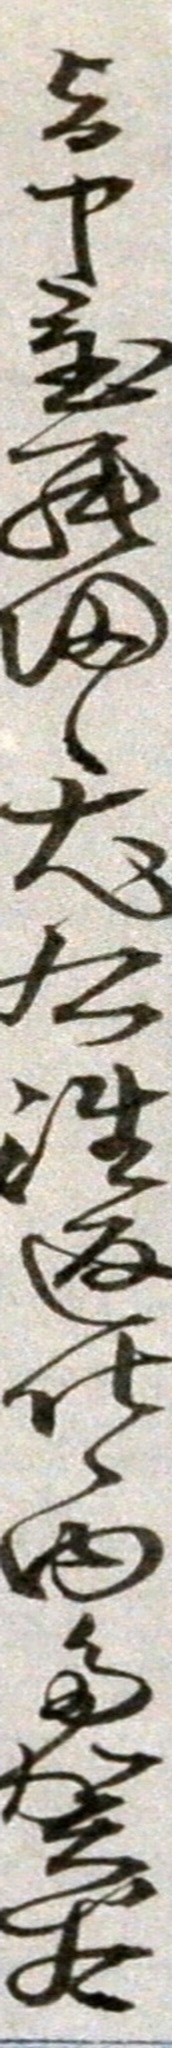旨申置罷帰候尤右往返仕候内多賀谷
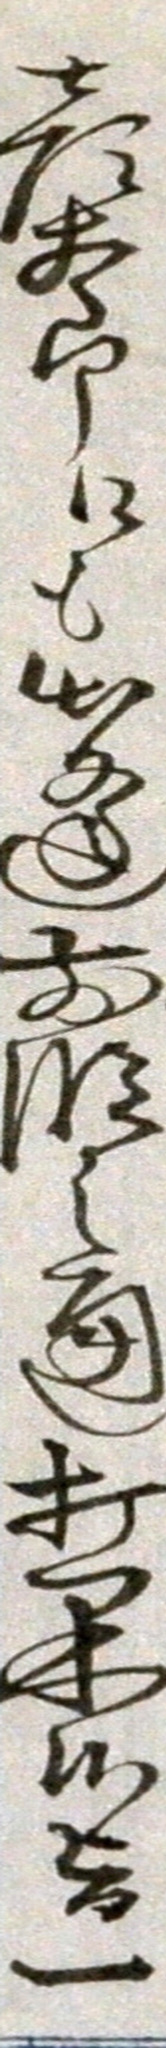彦太郎にも出逢前段之通打果候旨一
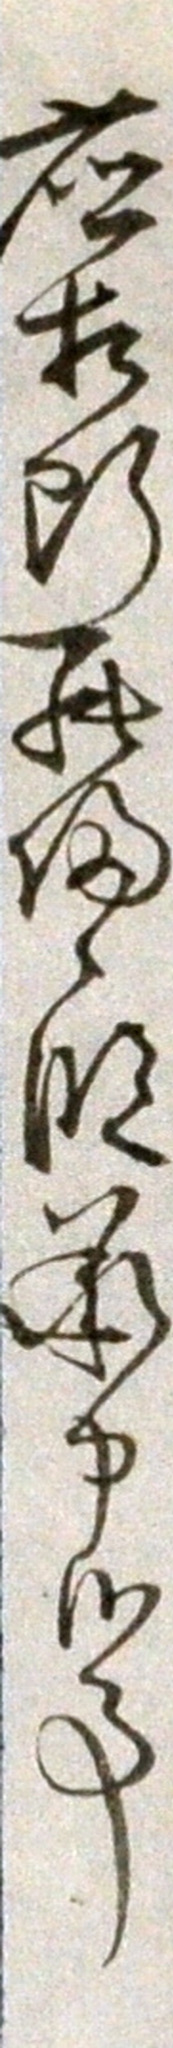応相断罷帰候段承申候事
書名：川面小藤太子細有之多賀谷唯右衛門ヲ打果候一件
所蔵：伊那市立高遠町図書館・合同会社AMANE
